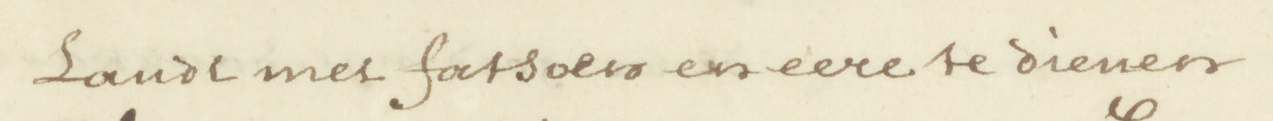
Landt met fatsoen en eere te dienen.
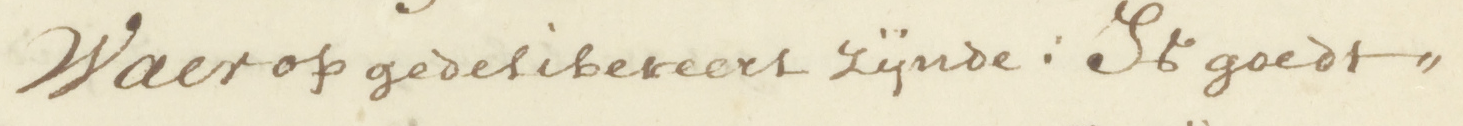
Waer op gedelibereert zijnde, Is goedt„
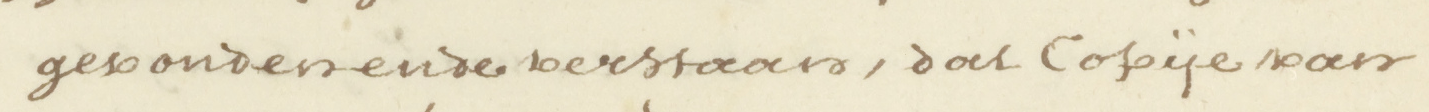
gevonden ende verstaan, dat copije van
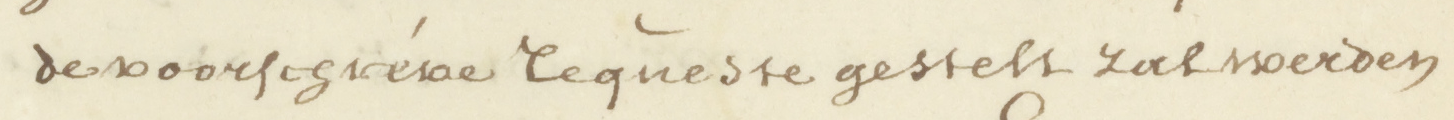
de voorschreve requeste gestelt zal werden
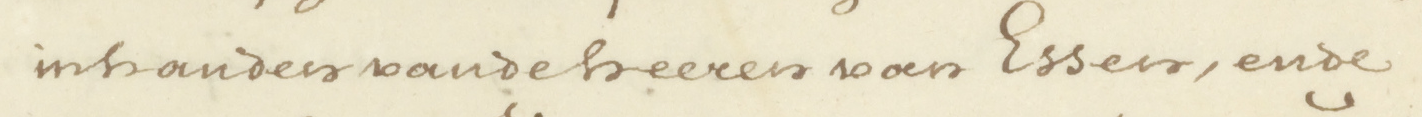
in handen van de heeren van Essen, ende
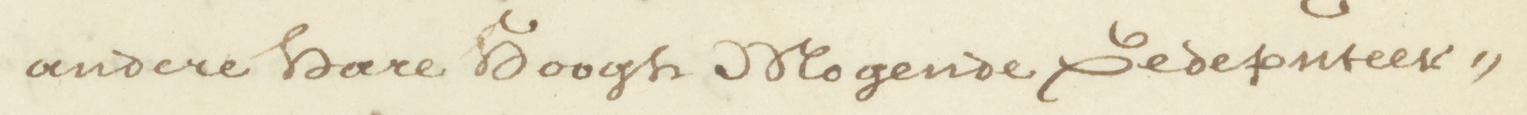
andere hare Hoogh Mogende Gedeputeer„
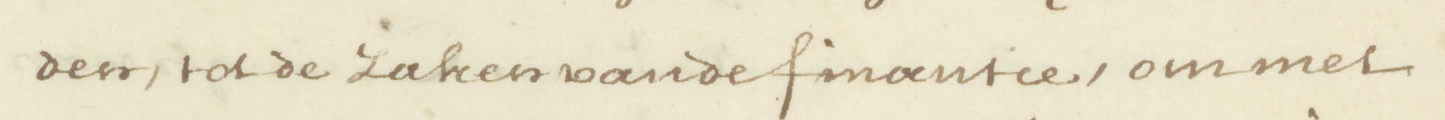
den, tot de zaken vande finantie, om met
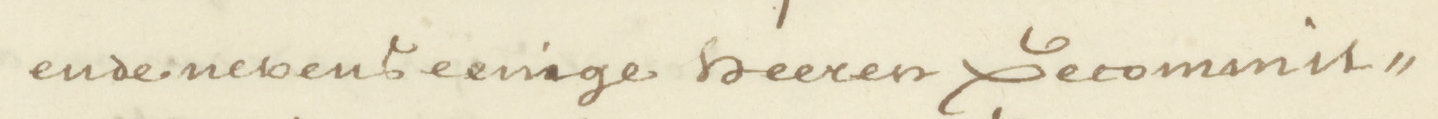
ende nevens eenige heeren Gecomit„
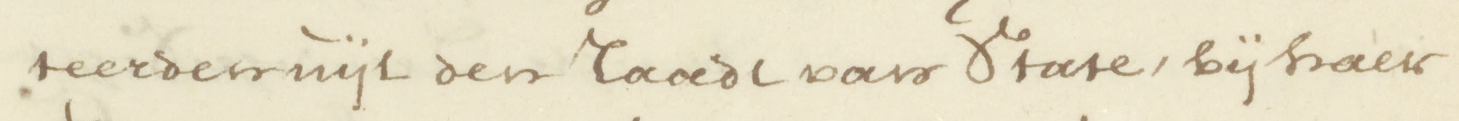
teerden uijt den Raadt van State, bij haer
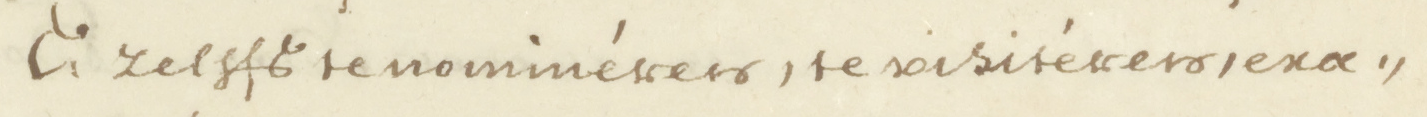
E. zelffs te nomineren, te visiteren, exa„
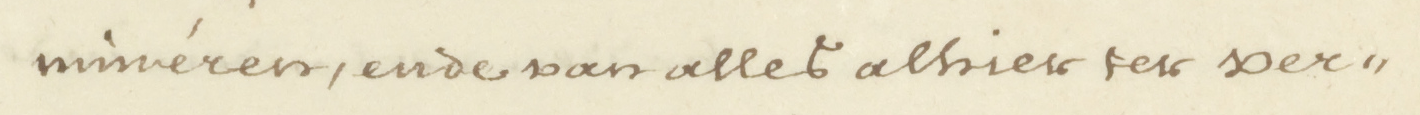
mineren, ende van alles alhier ter ver„
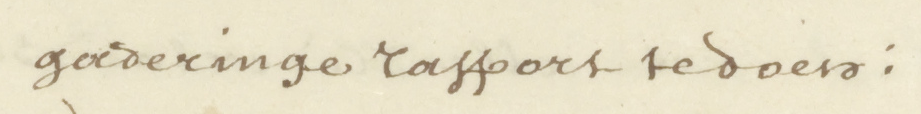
gaderinge rapport te doen:
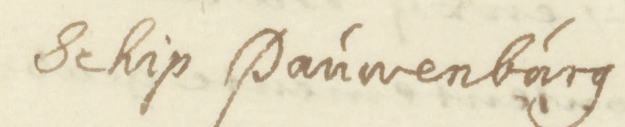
Schip Pauwenborg
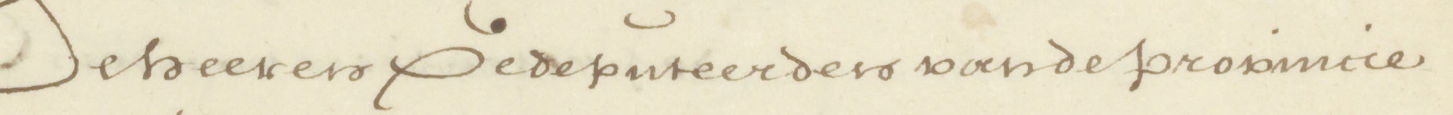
Den heeren Gedeputeerden van de provincie
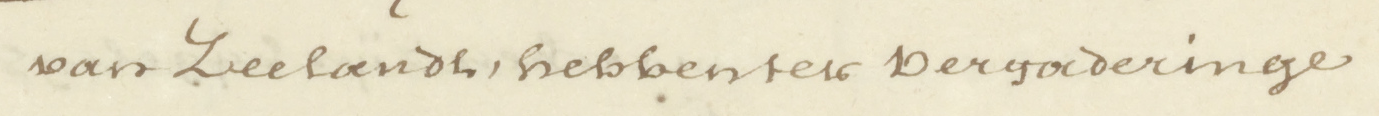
van Zeelandt, hebben ter vergaderinge
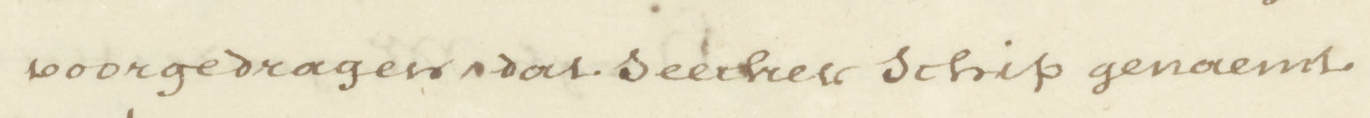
voorgedragen dat seecker schip genaemt
